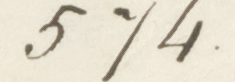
574
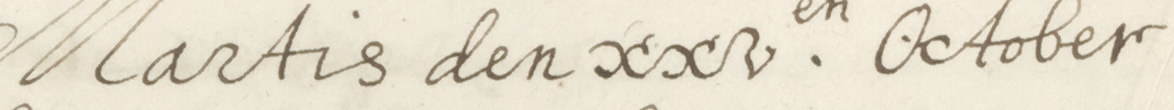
Martis den xxven October
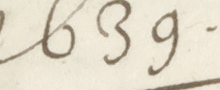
1639
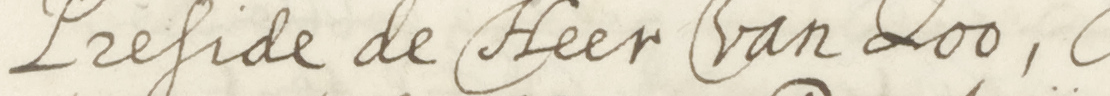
Preside de Heer van Loo,
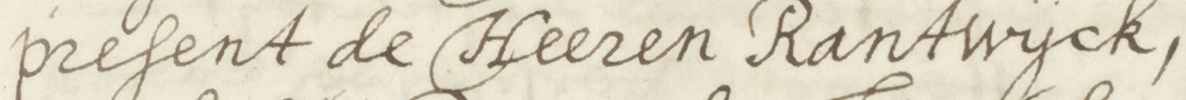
present de Heeren Rantwijck,
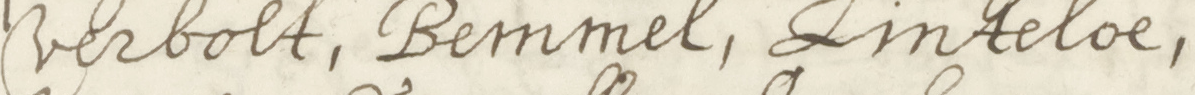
Verbolt, Bemmel, Linteloe,
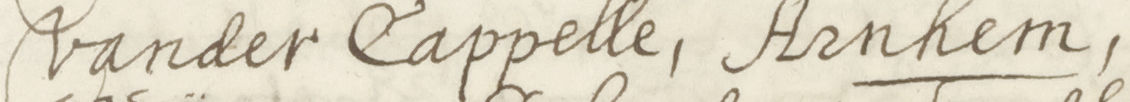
vander Cappelle, Arnhem,
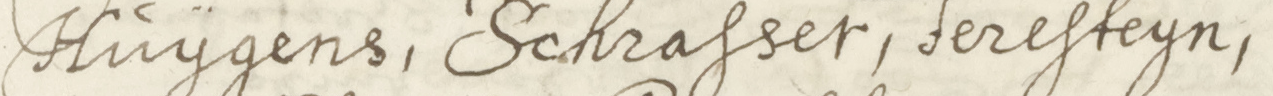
Huijgens, Schrasser, Teresteijn,
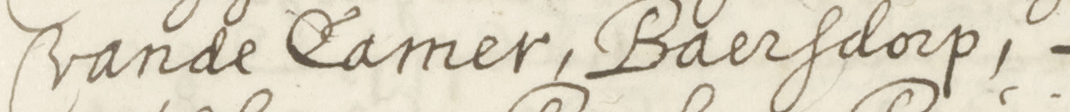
vande Camer, Baersdorp —
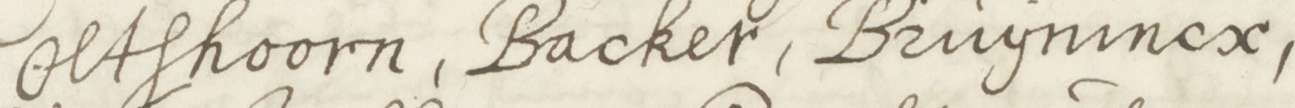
Oltshoorn, Backer, Bruijnincx,
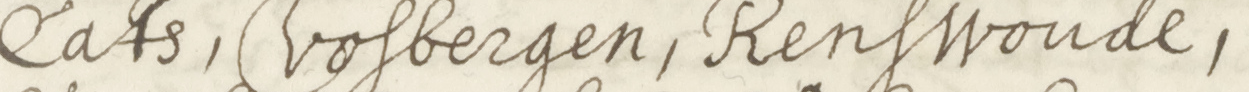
Cats, Vosbergen, Renswoude,
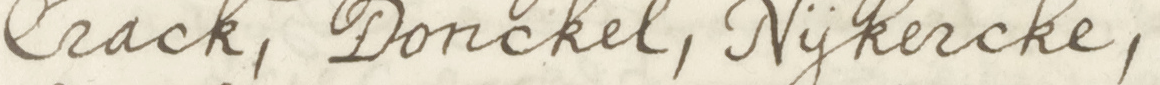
Crack, Donckel, Nijkercke,
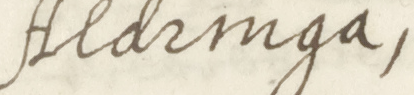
Aldringa.
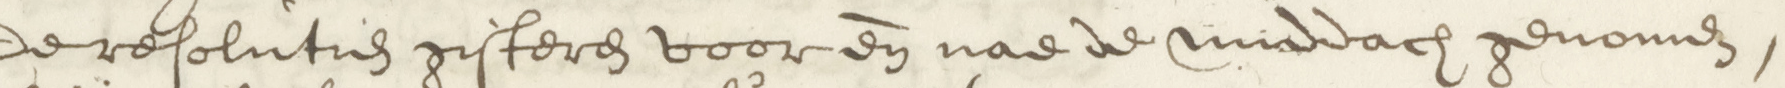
De resolutien gisteren voor en nae de middach genomen,
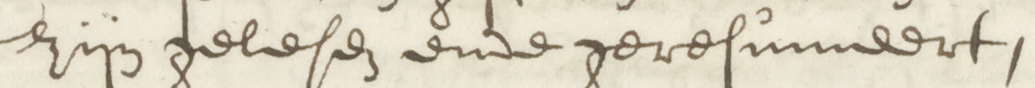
zijn gelesen ende geresumeert.
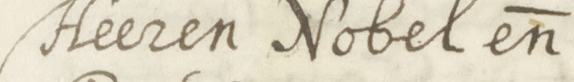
Heeren Nobel en
